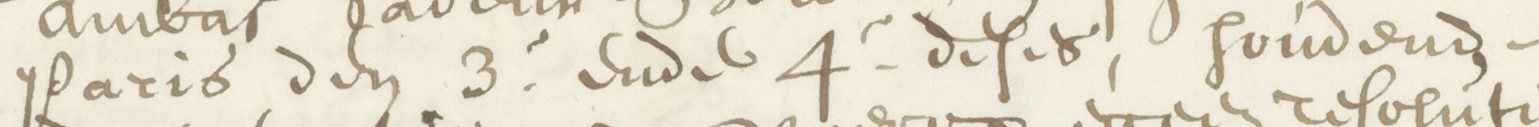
Paris den 3e. ende 4e. deses, houdende
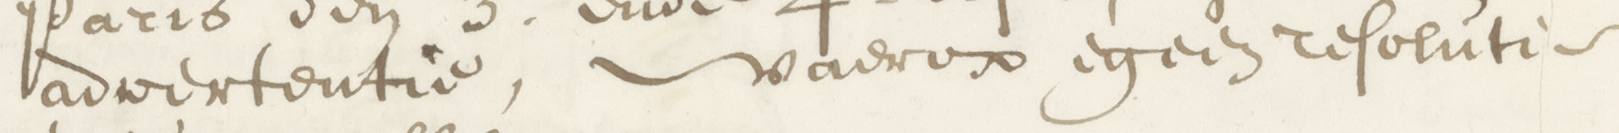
advertentie, Waerop egeen resolutie
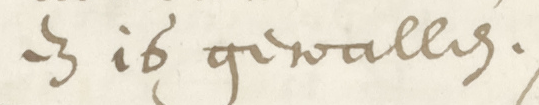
en is gevallen.
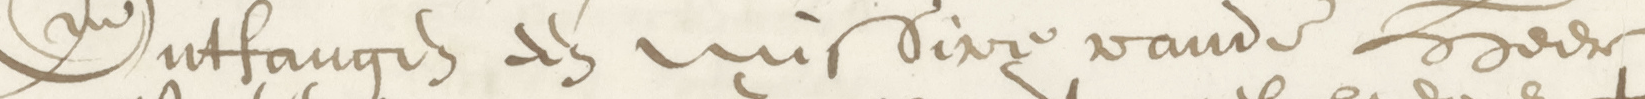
Ontfangen een Missive vande Heer
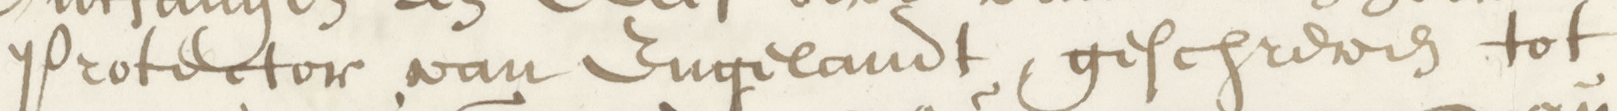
Protector van Engelandt, geschreven tot
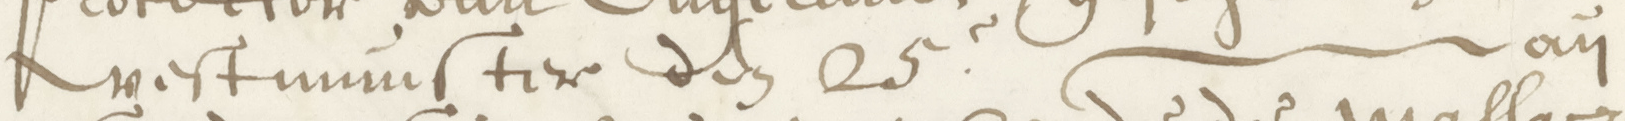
Westmunster den 25e. Maij
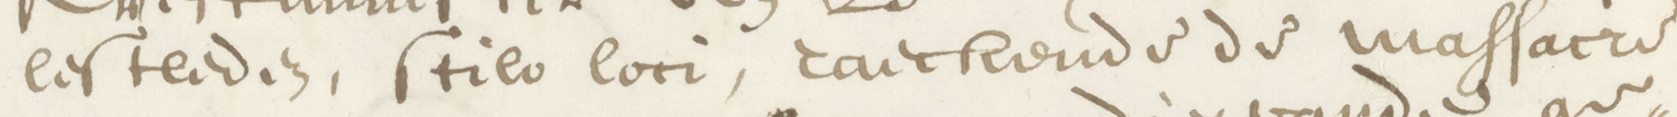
lestleden, stilo loci, raeckende de massacre
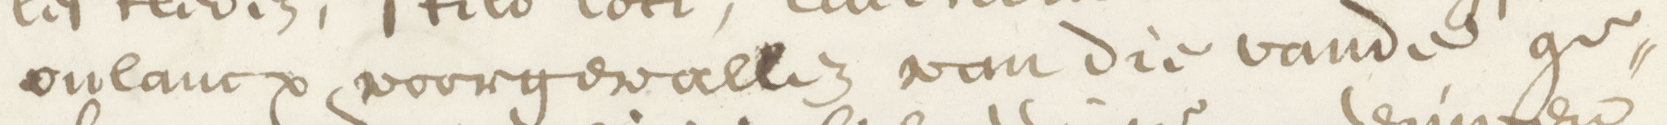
onlancx, voorgevallen van die vande ge„
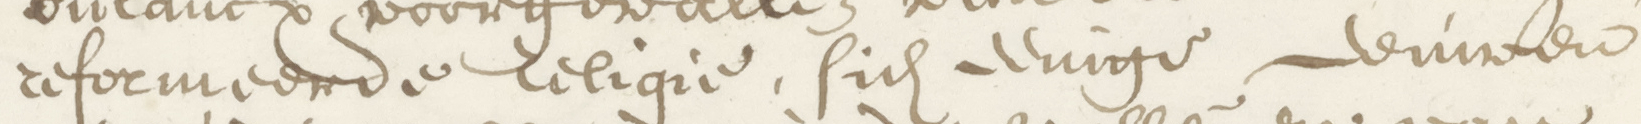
reformeerde religie, sich eenige eeuwen
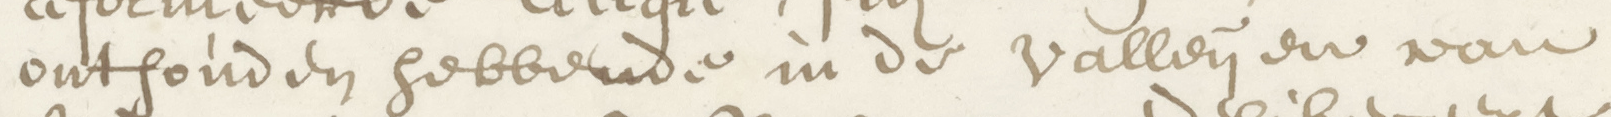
onthouden hebbende in de valleijen van
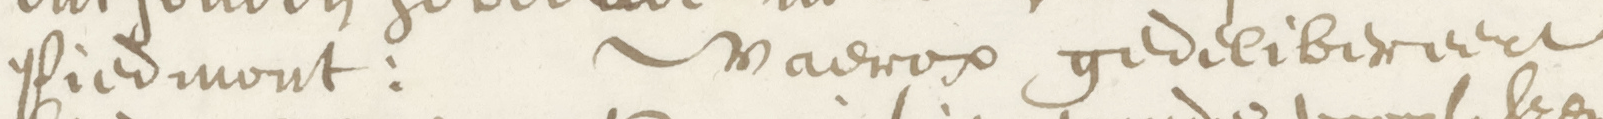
Piedmont: Waerop gedelibereert
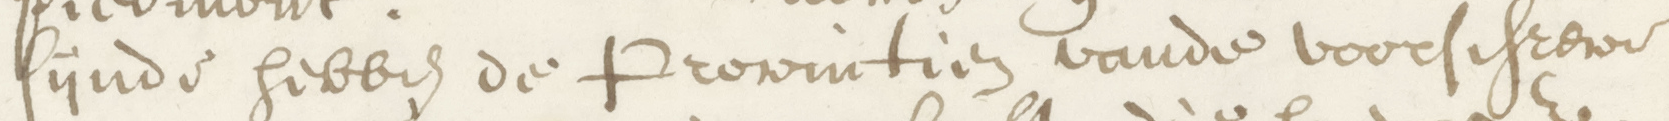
sijnde hebben de Provintien vande voorschreve
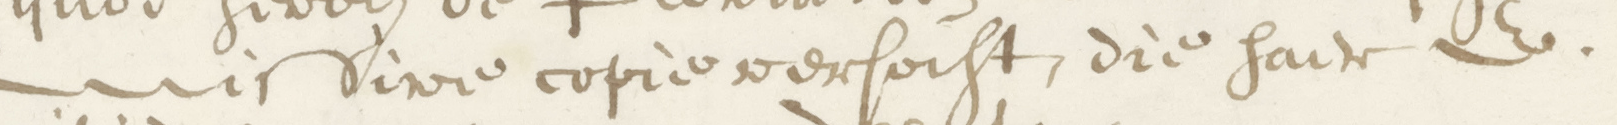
Missive copie versocht, die haer E.
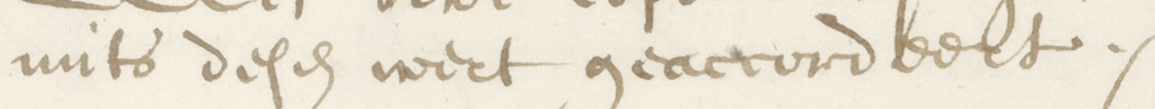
mits desen wert geaccordeert.
